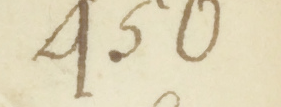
456
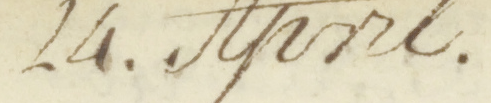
24. April.
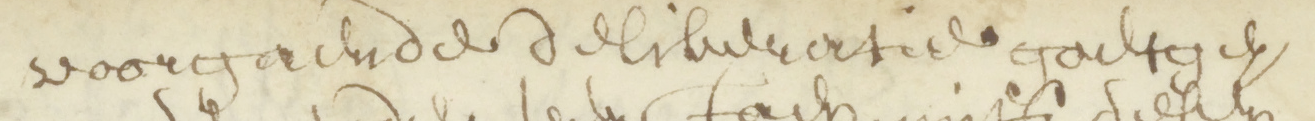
voorgaende deliberatie goetge,,
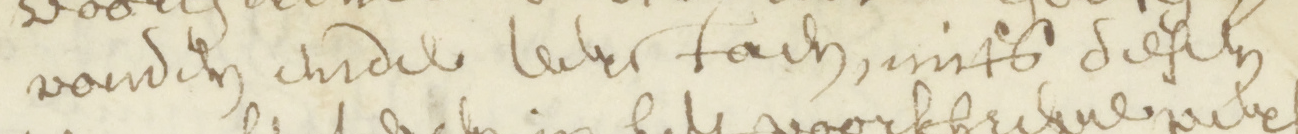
vonden ende verstaen, mits desen
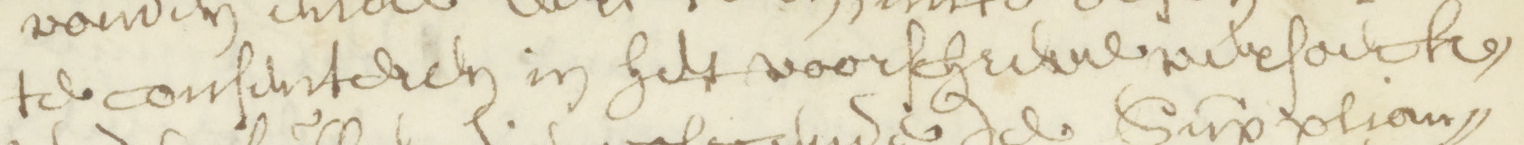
te consenteren in het voorschreve versoeck,
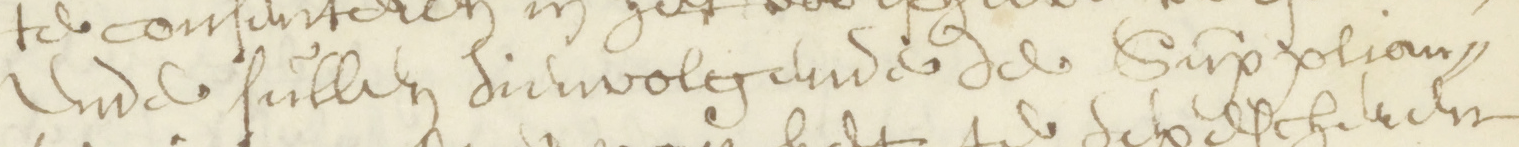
ende sullen dienvolgende de Supplian,,
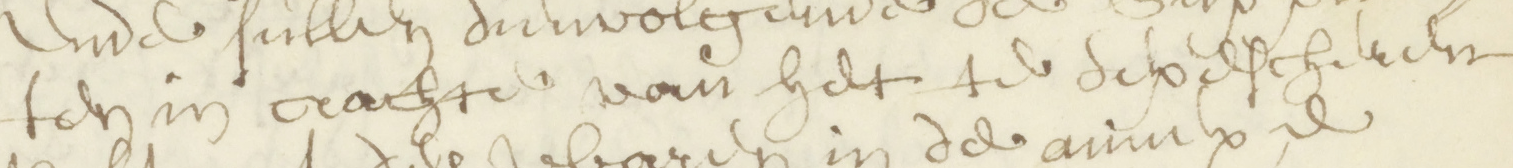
ten in crachte van het te depescheren
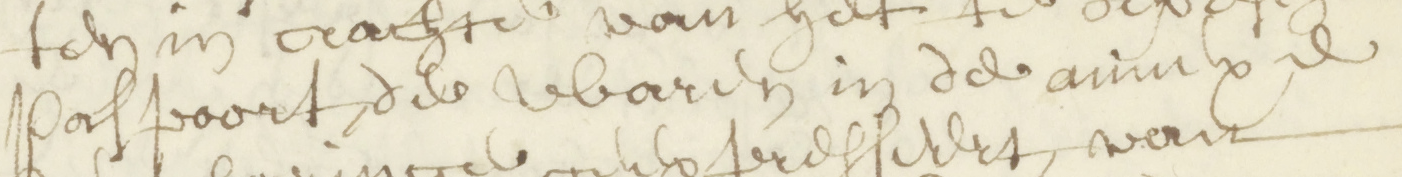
Paspoort, de waren in de annexe
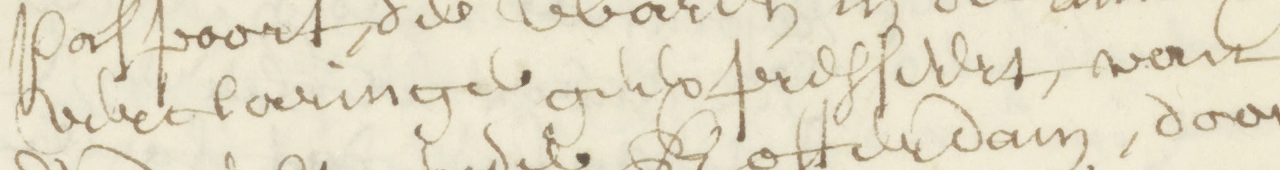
verclaringe geexpresseert, van
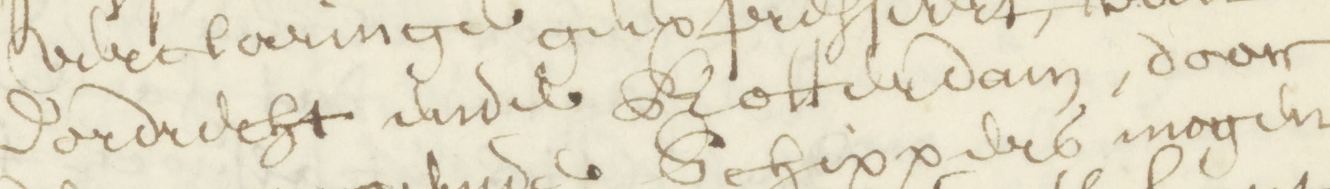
Dordrecht ende Rotterdam, door
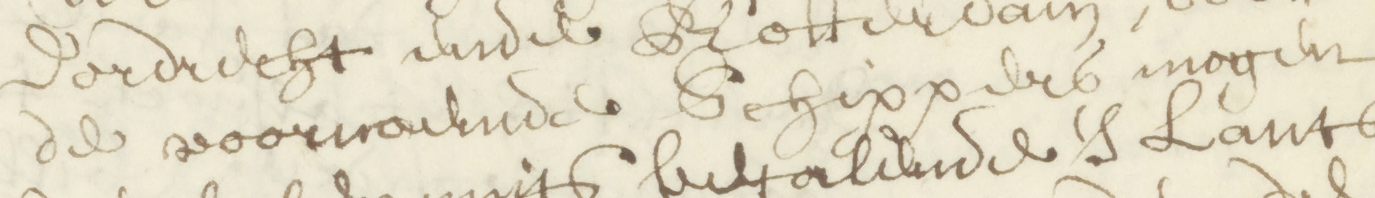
de voornoemde Schippers mogen
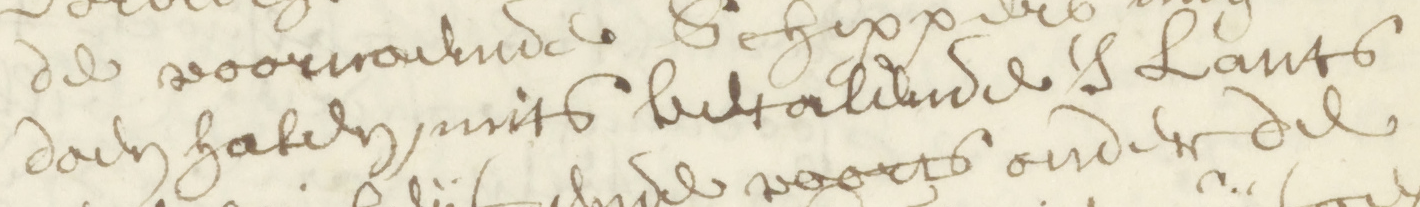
doen halen, mits betalende 's Lants
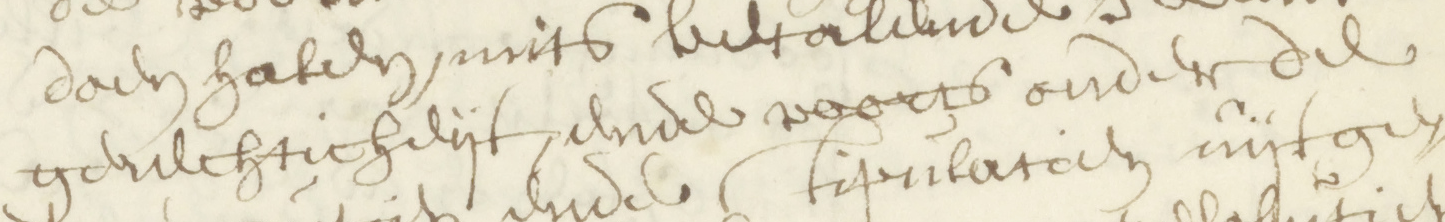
gerechticheijt ende voorts onder de
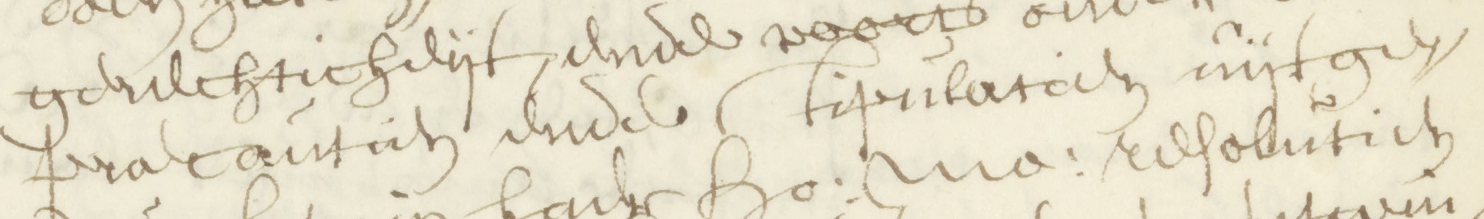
præcautien ende stipulatien uijtge,,
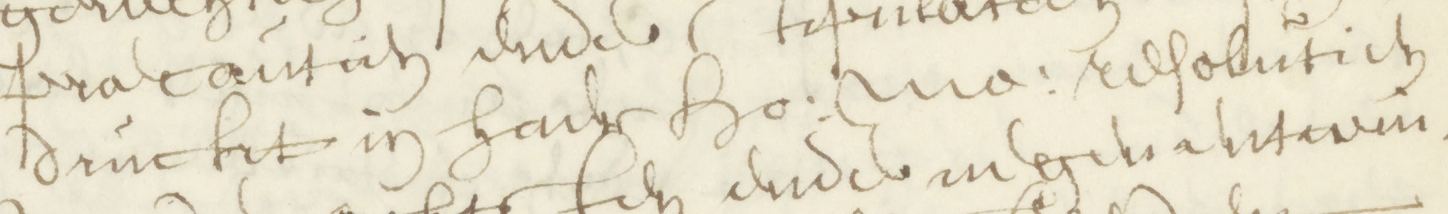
druckt in haer Ho:Mo: resolutien
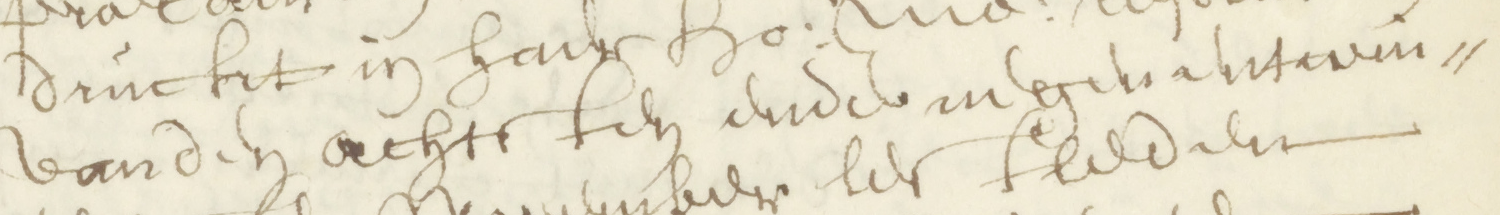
van den achtsten ende negenentwin„
